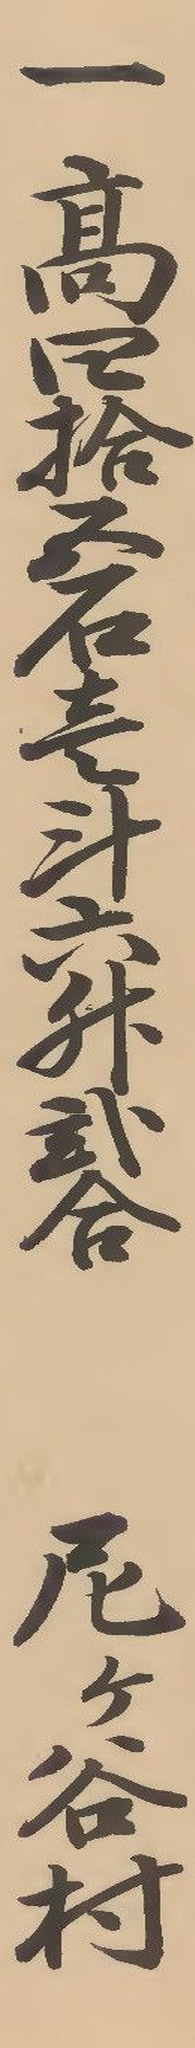一高四拾五石壱斗六升弐合尼ヶ谷村
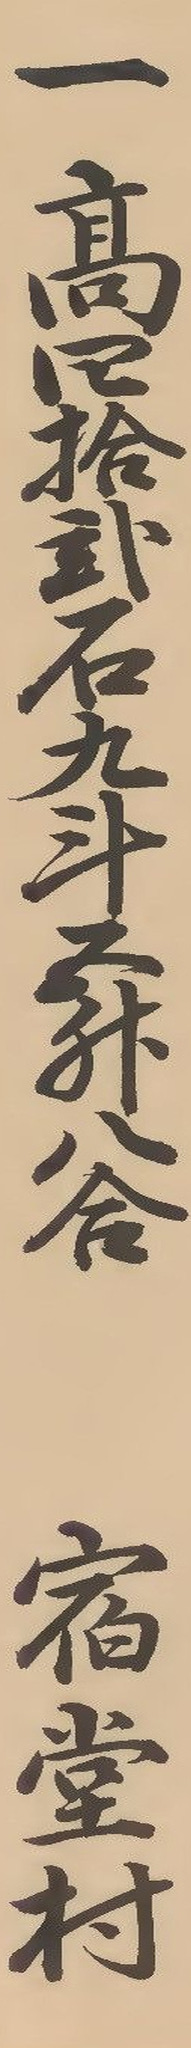一高四拾弐石九斗五升八合宿堂村

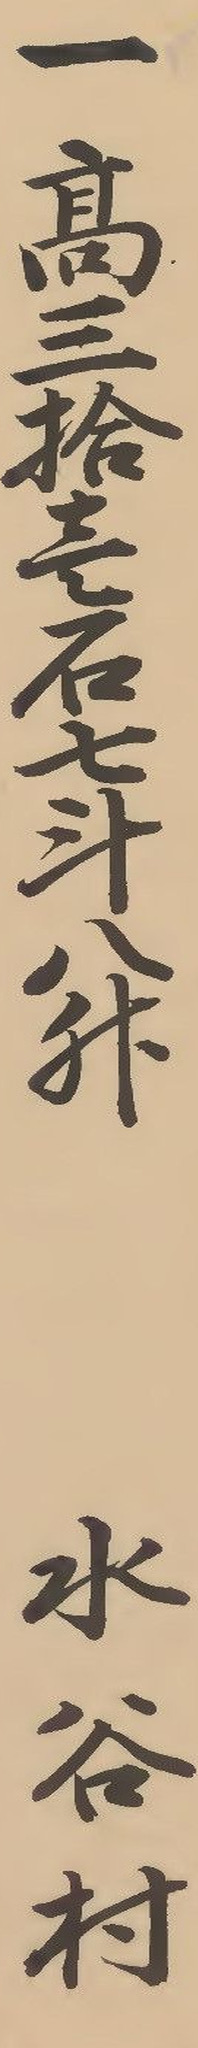一高三拾壱石七斗八升水谷村
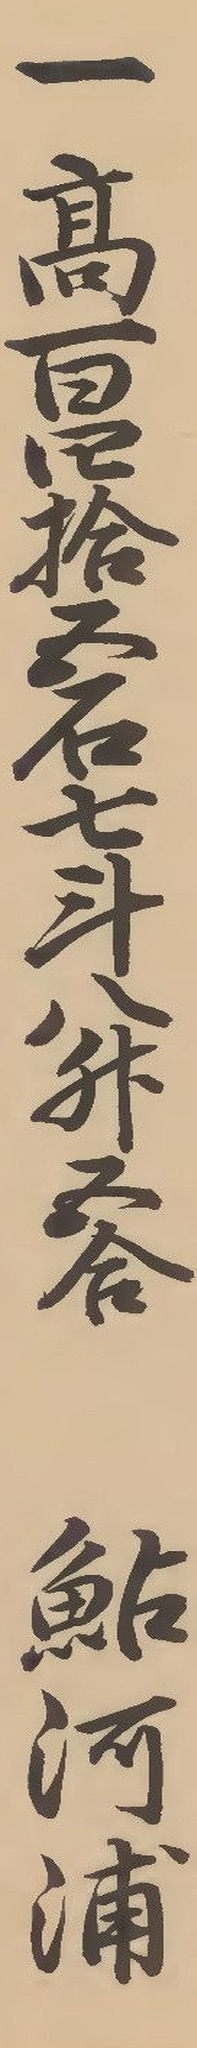一高百四拾五石七斗八升五合鮎河浦
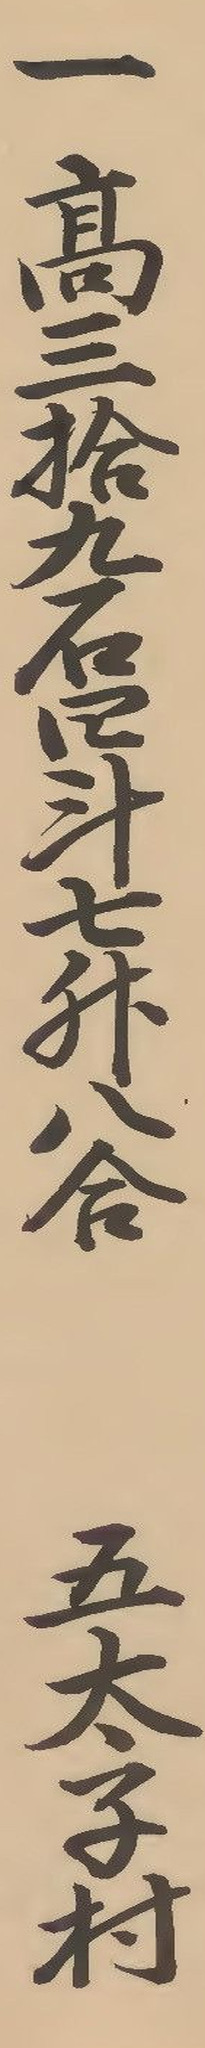一高三拾九石四斗七升八合五太子村
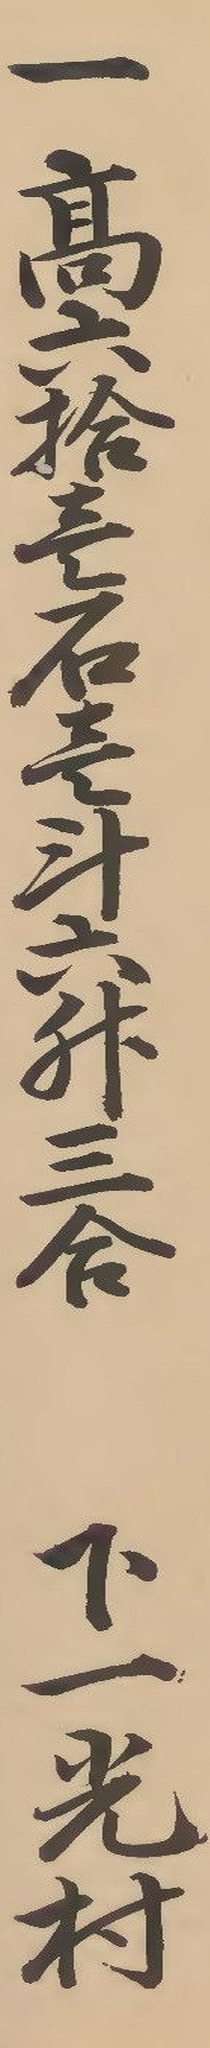一高六拾壱石壱斗六升三合下一光村
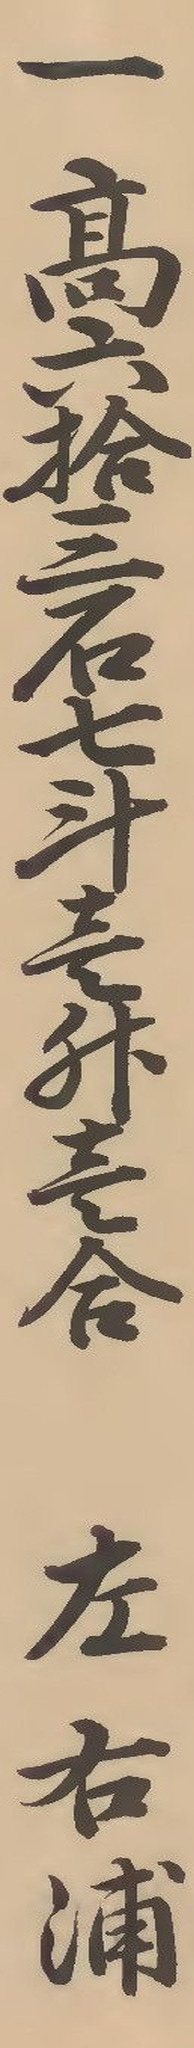一高六拾三石七斗壱升壱合左右浦
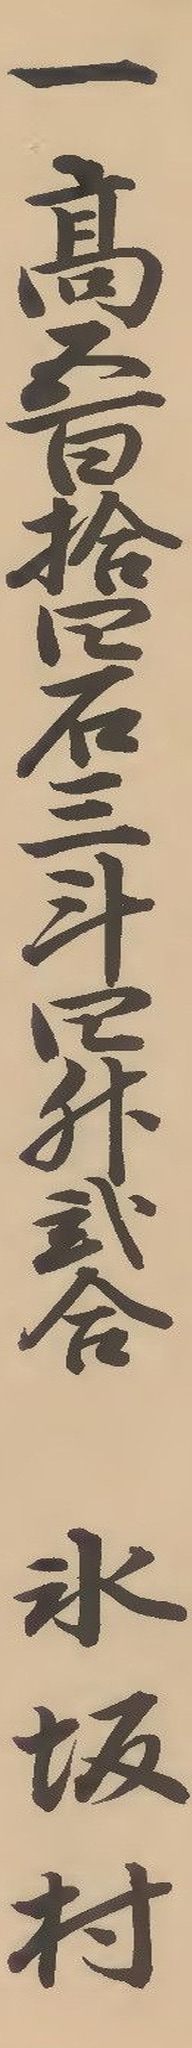一高五百拾四石三斗四升弐合氷坂村
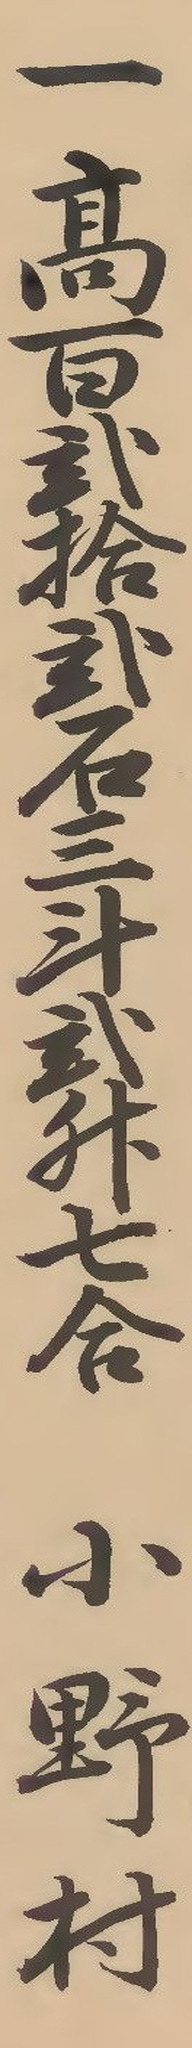一高百弐拾弐石三斗弐升七合小野村

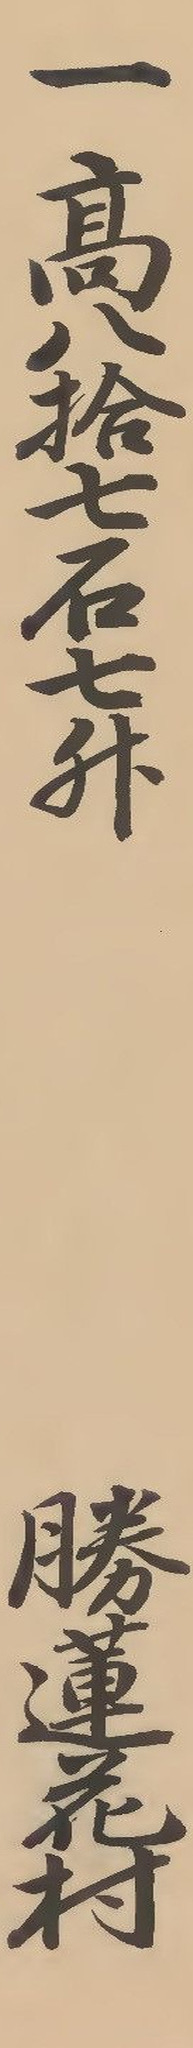一高八拾七石七升勝蓮花村
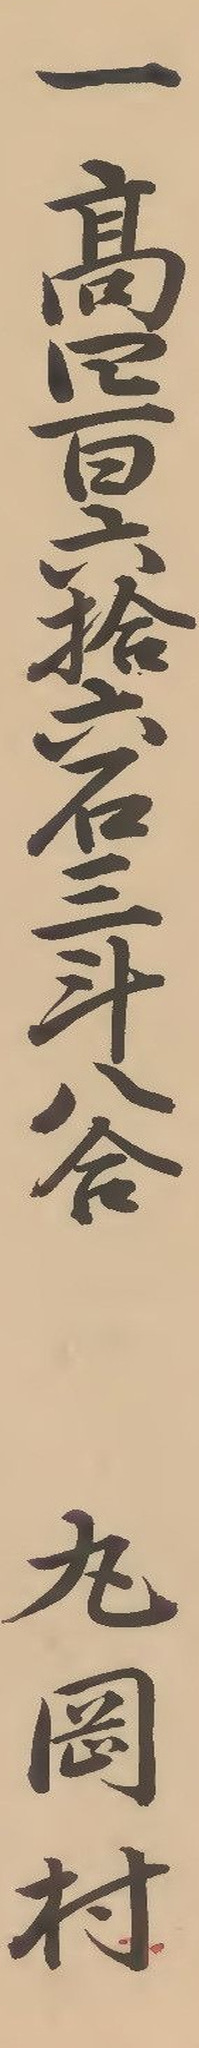一高四百六拾六石三斗八合丸岡村
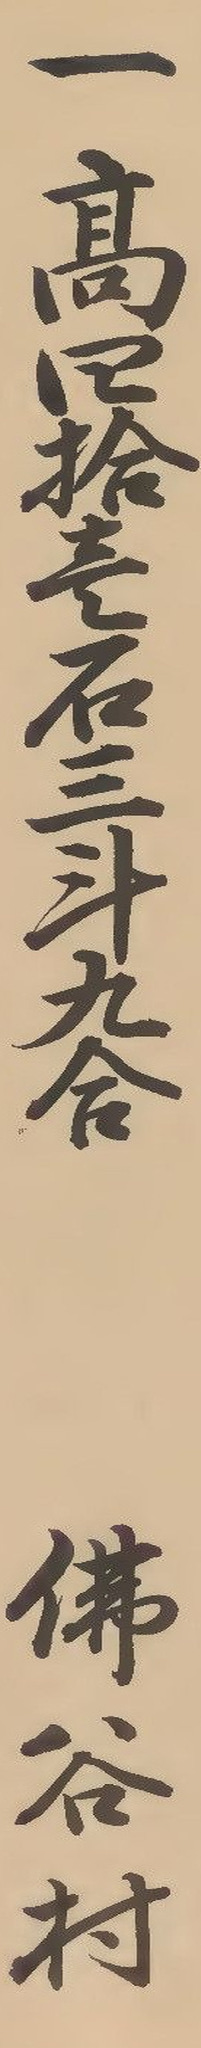一高四拾壱石三斗九合仏谷村
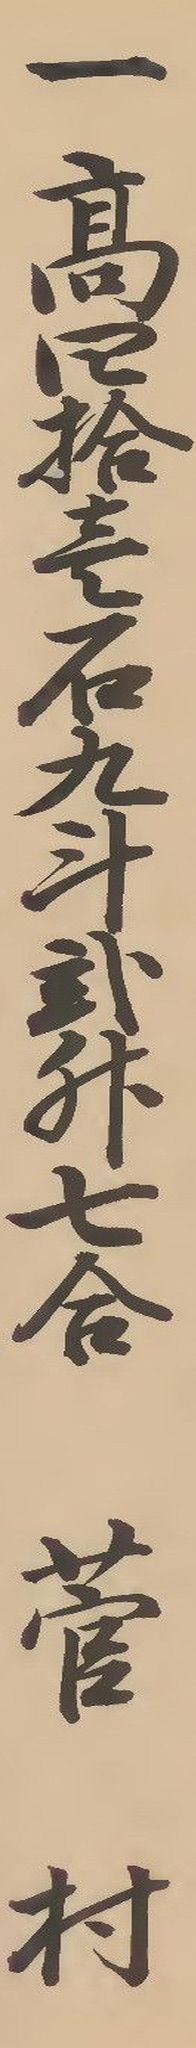一高四拾壱石九斗弐升七合菅村
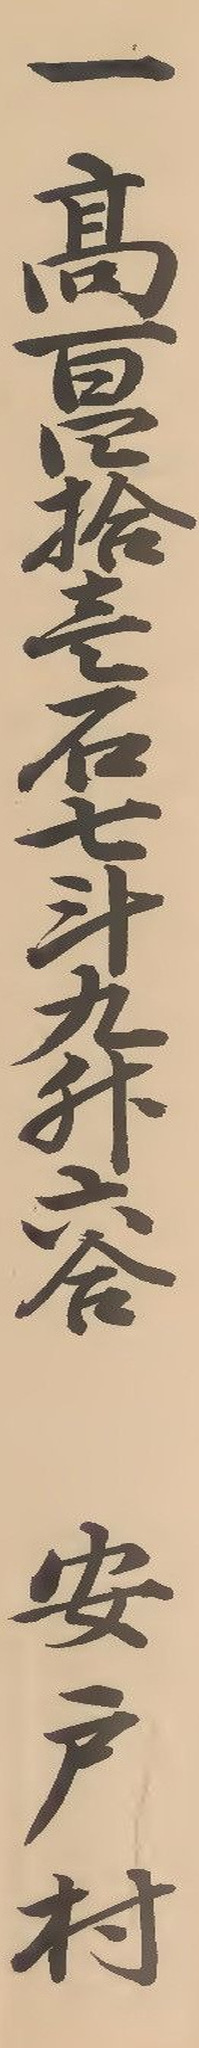一高百四拾壱石七斗九升六合安戸村
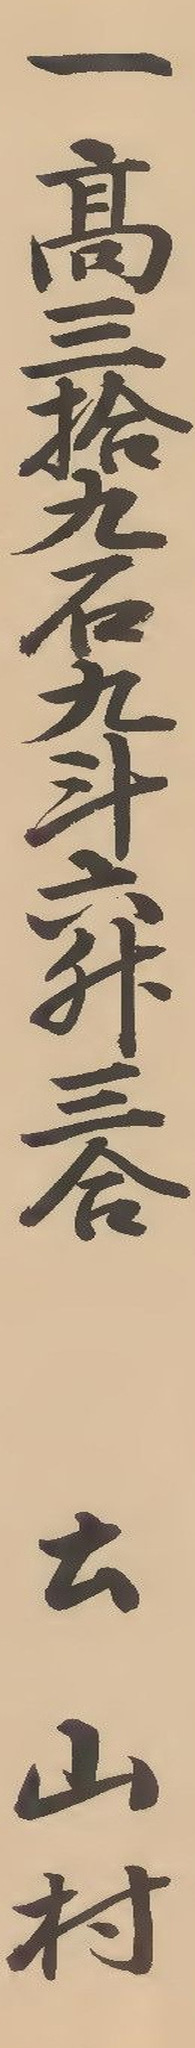一高三拾九石九斗六升三合土山村
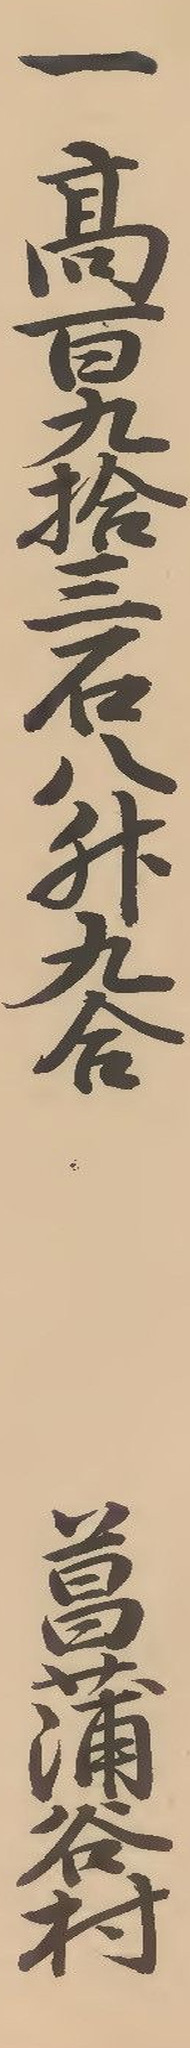一高百九拾三石八升九合菖蒲谷村
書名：越前国郷帳
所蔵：国立公文書館 National Archives of Japan
